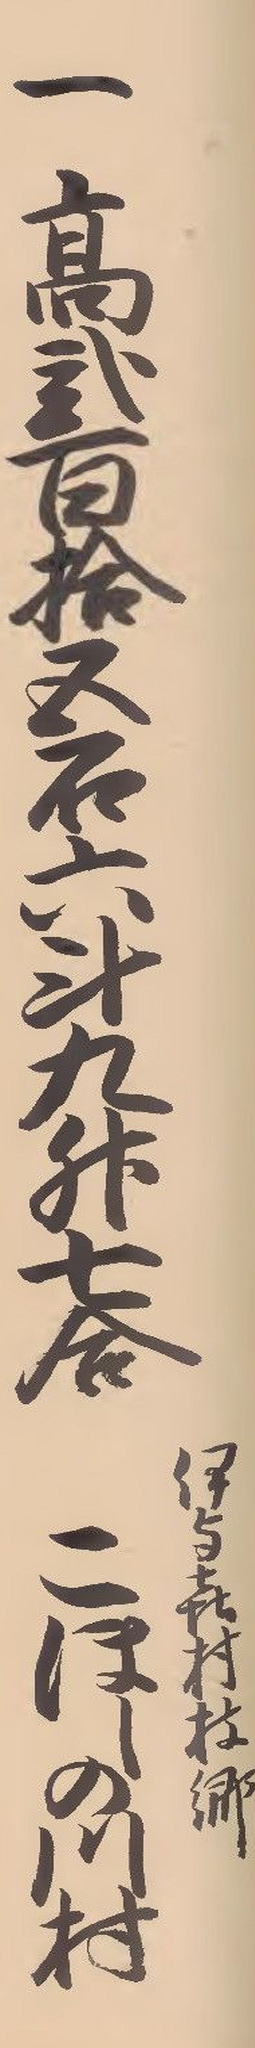一髙弐百拾五石六斗九升七合こほしの川村
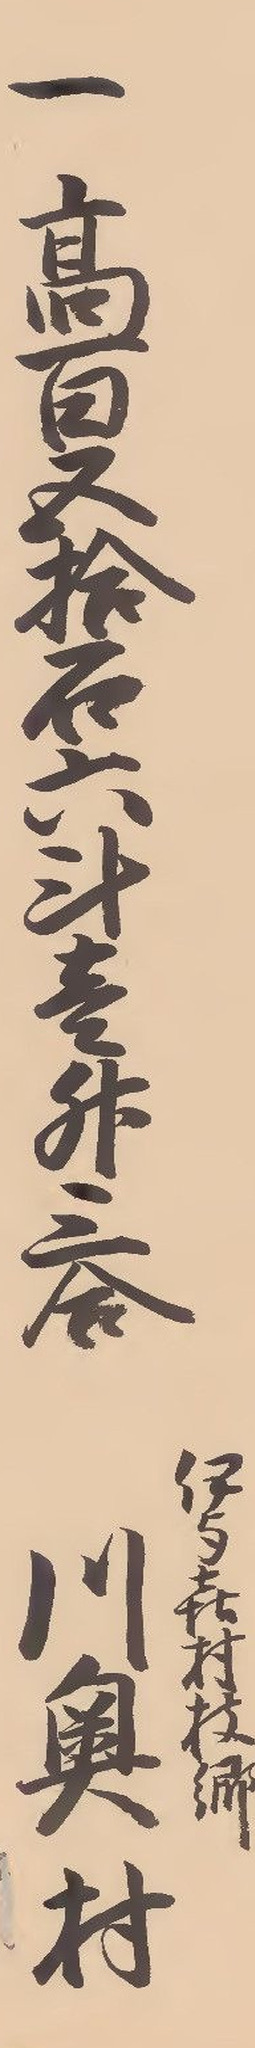一髙百五拾石六斗壱升三合川奥村
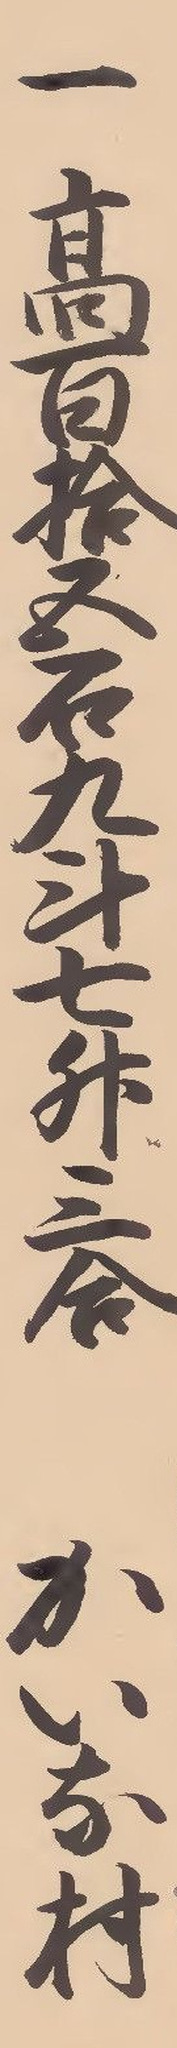一髙百拾五石九斗七升三合かいな村
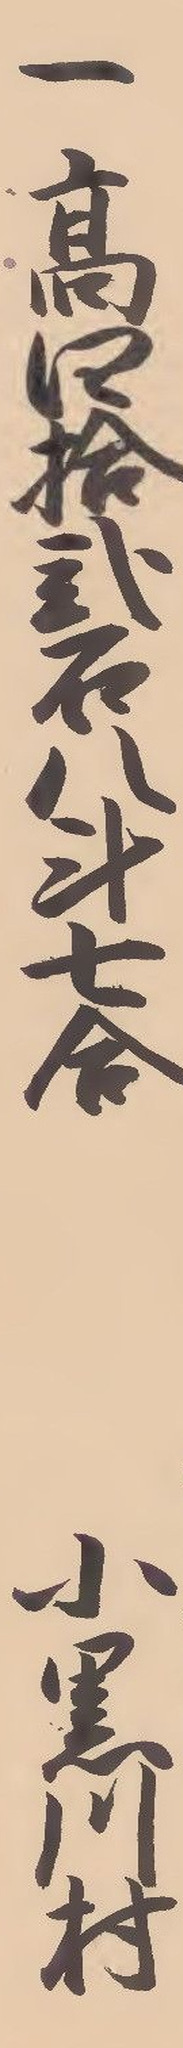一髙四拾弐石八斗七合小黑川村

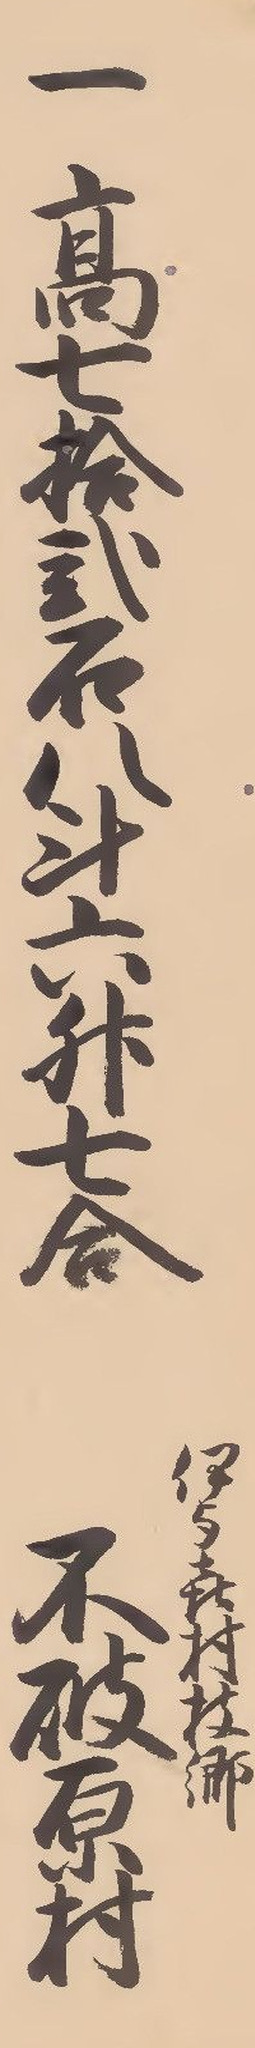一髙七拾弐石八斗六升七合不破原村
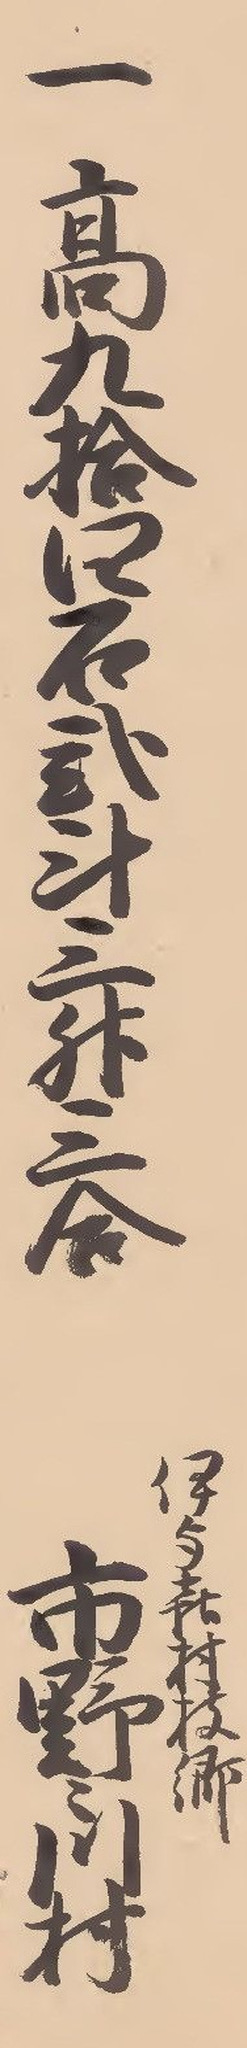一髙九拾四石弐斗三升三合市野々川村
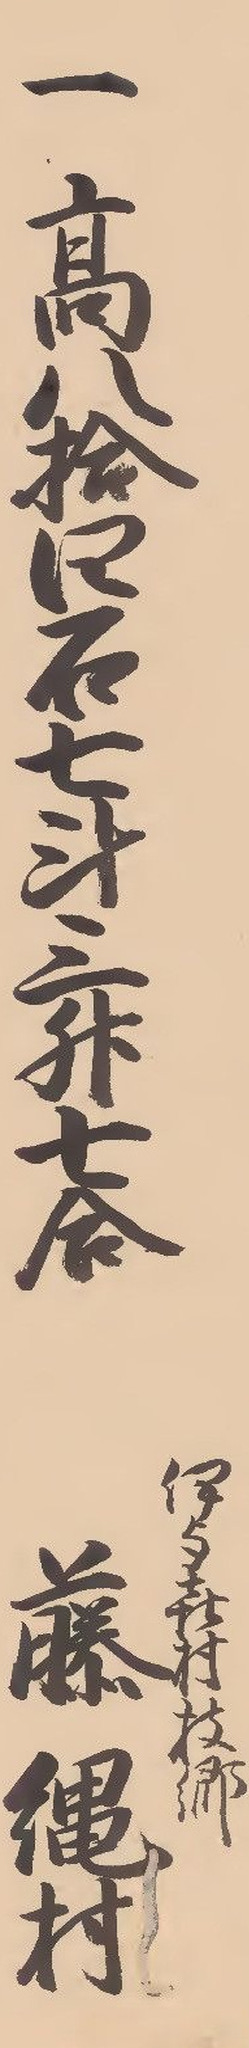一髙八拾四石七斗三升七合藤縄村
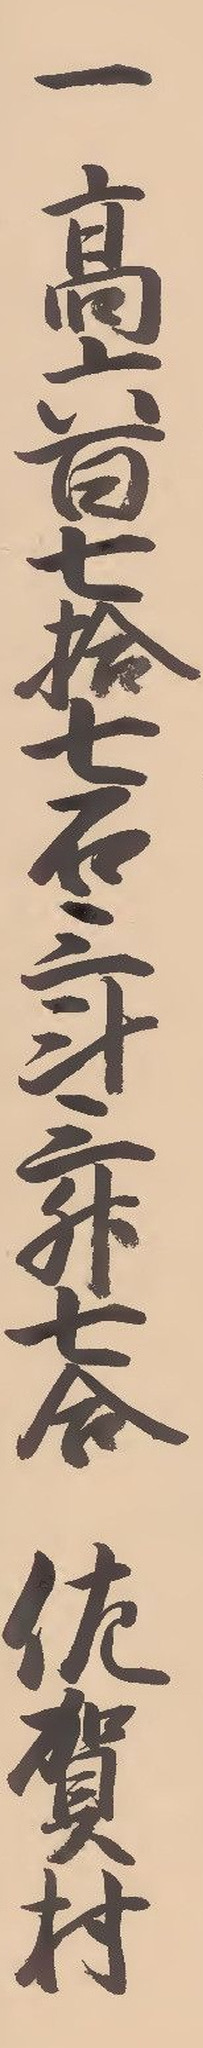一髙六百七拾七石三斗三升七合佐賀村
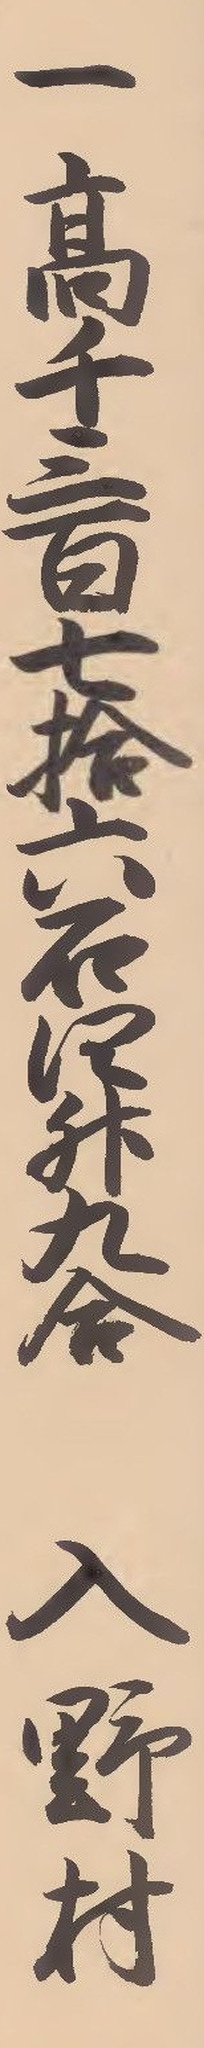一髙千三百七拾六石四斗九合入野村
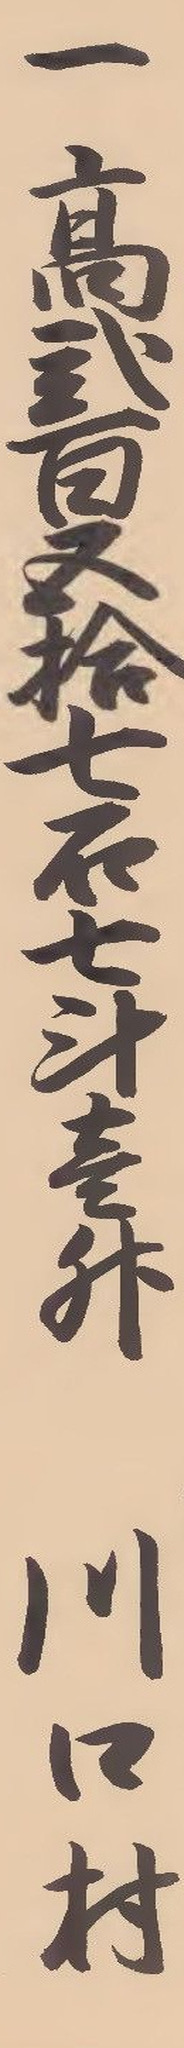一髙弐百五拾七石七斗壱升川口村
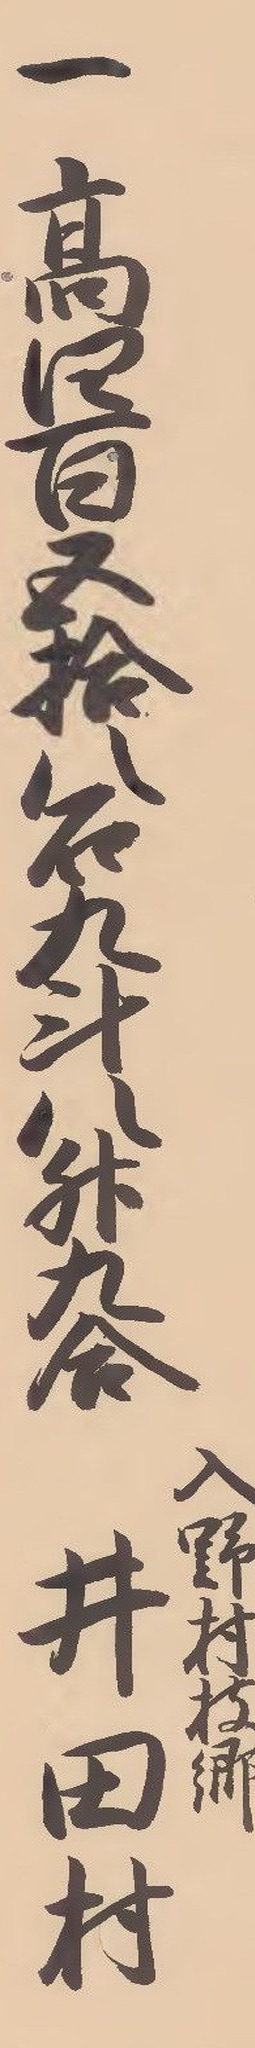一髙四百五拾八石九斗八升九合井田村

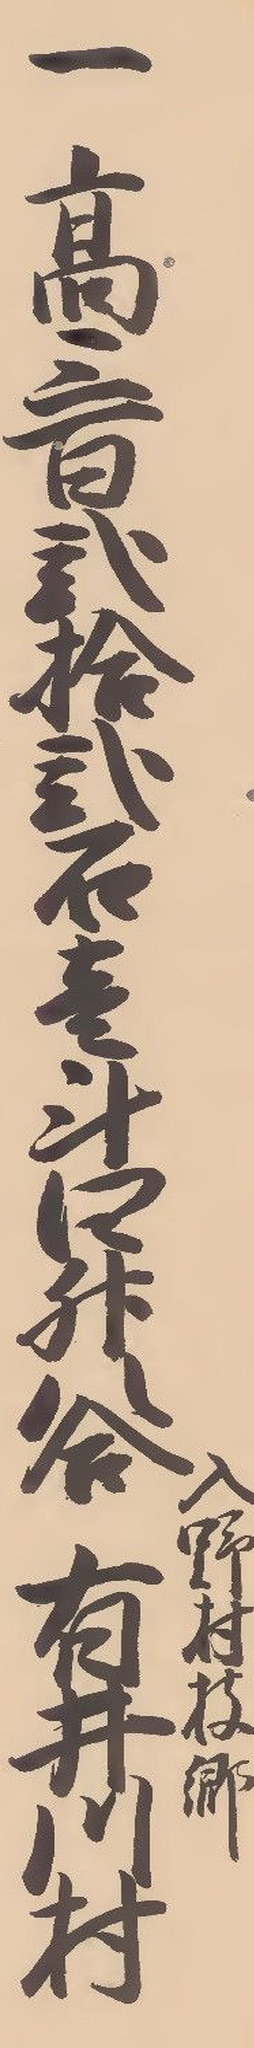一髙三百弐拾弐石壱斗四升八合有井川村
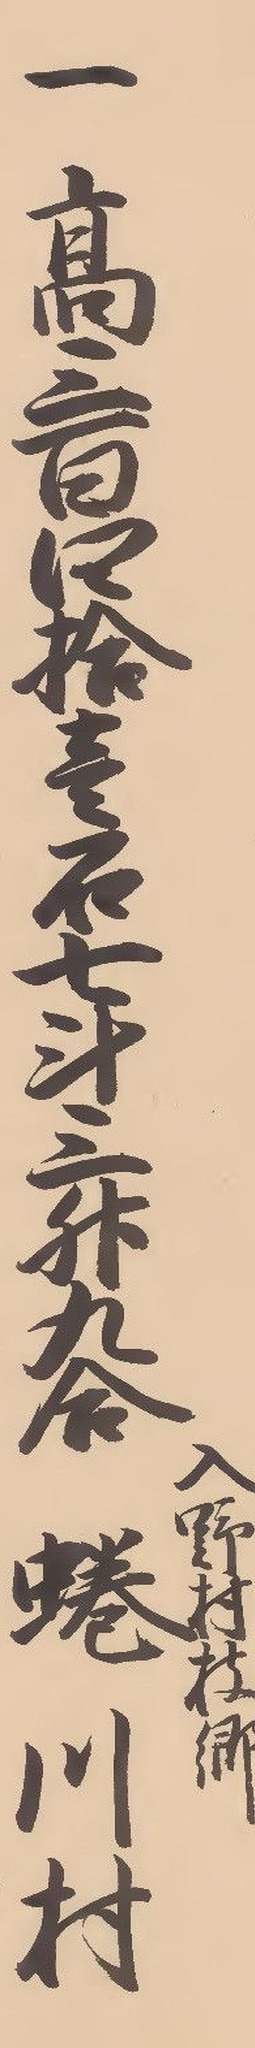一髙三百四拾壱石七斗三升九合蜷川村
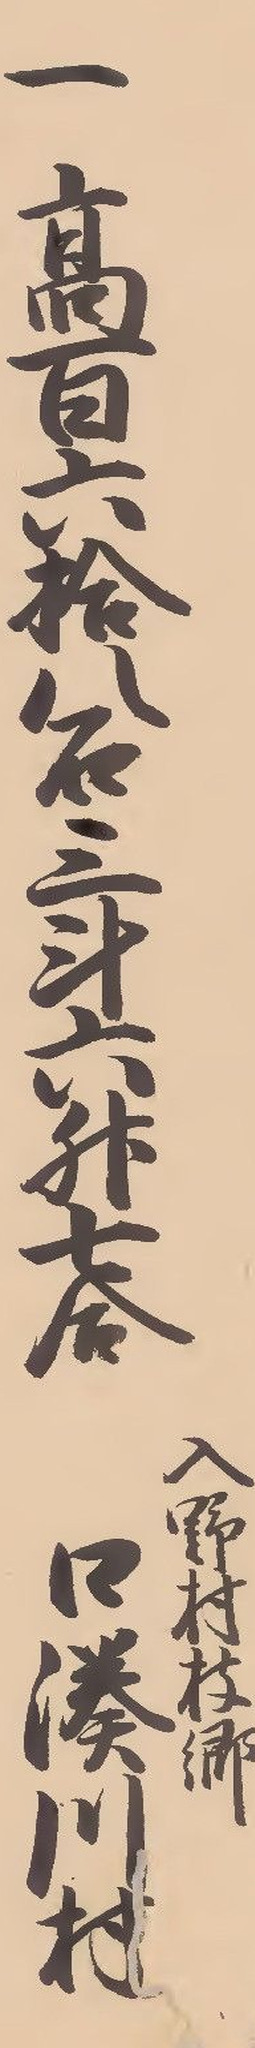一髙百六拾八石三斗六升七合口湊川村
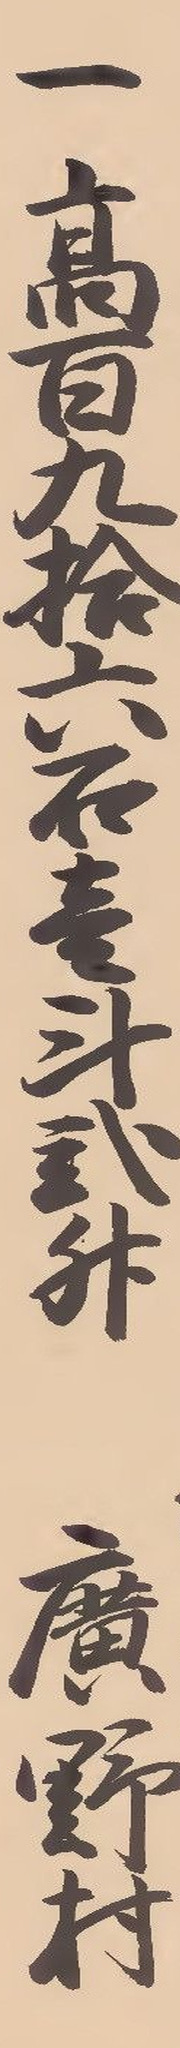一髙百九拾六石壱斗弐升廣野村
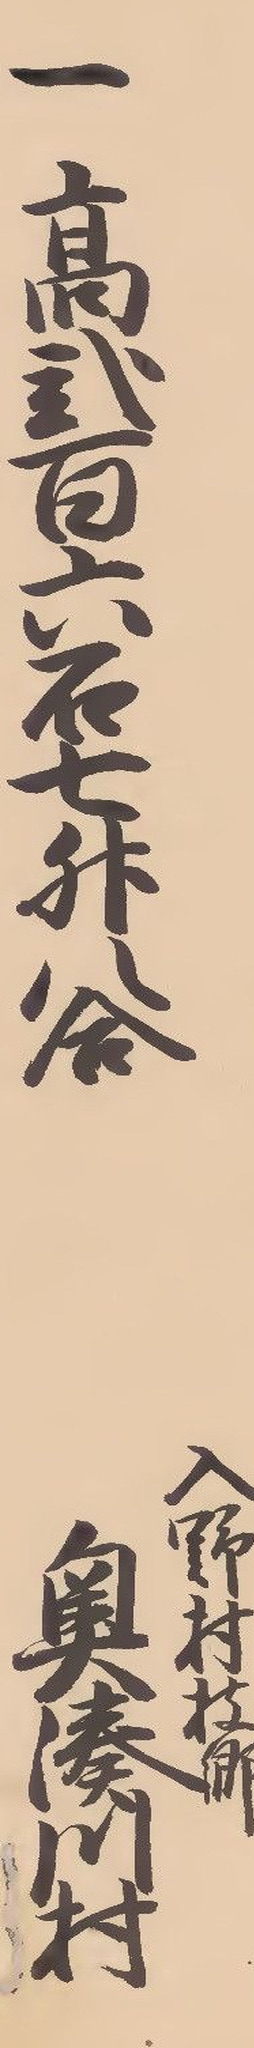一髙弐百六石七升八合奥湊川村
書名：土佐国郷帳
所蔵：国立公文書館 National Archives of Japan
